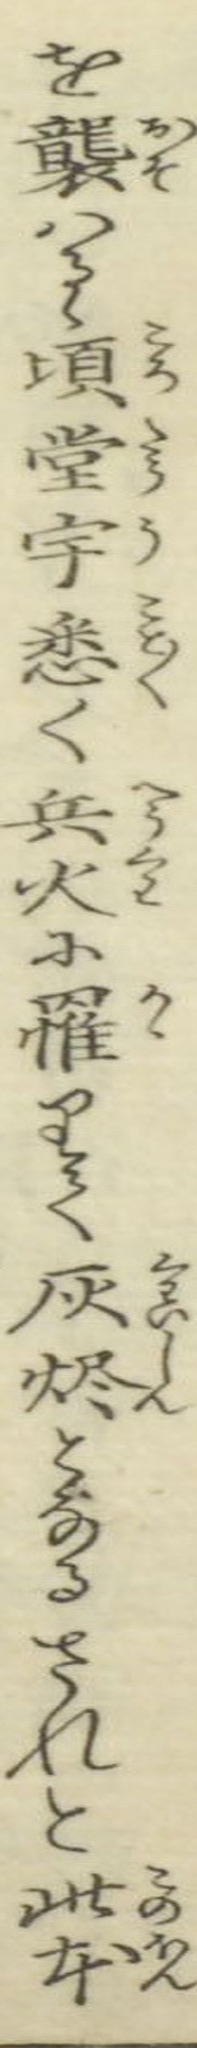を襲はるゝ頃堂宇悉く兵火に罹りて灰燼となるされと此本
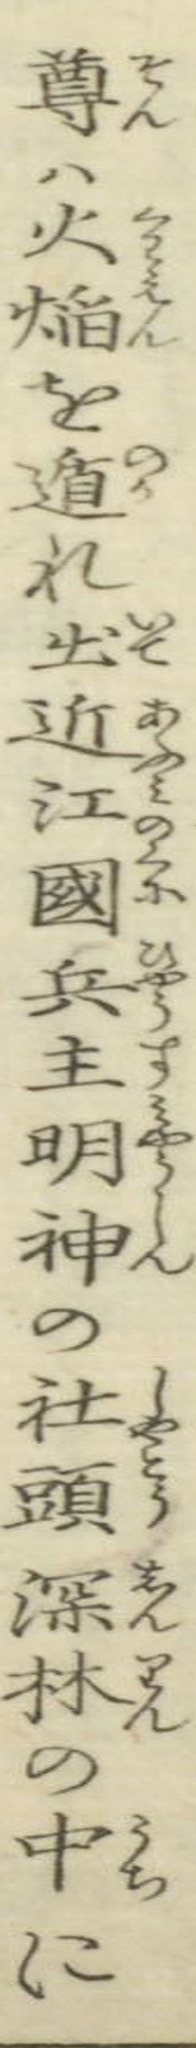尊は火焔を遁れ出近江國兵主明神の社頭深林の中に
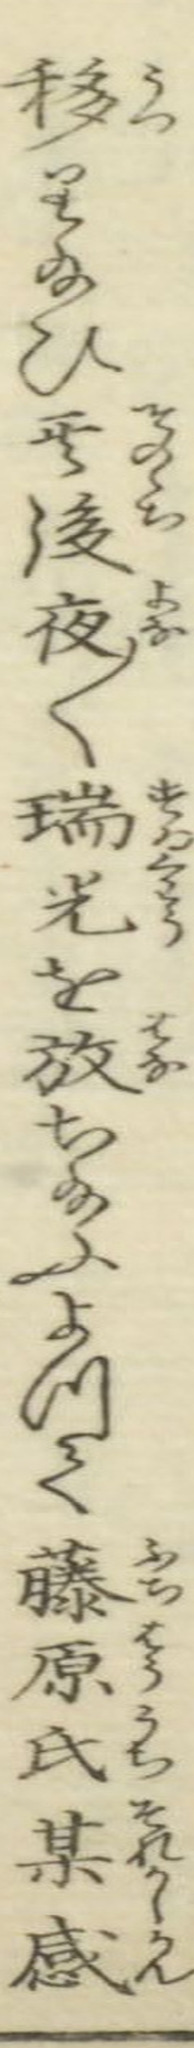移り給ひ其後夜〳〵瑞光を放ち給ふよつて藤原氏某感
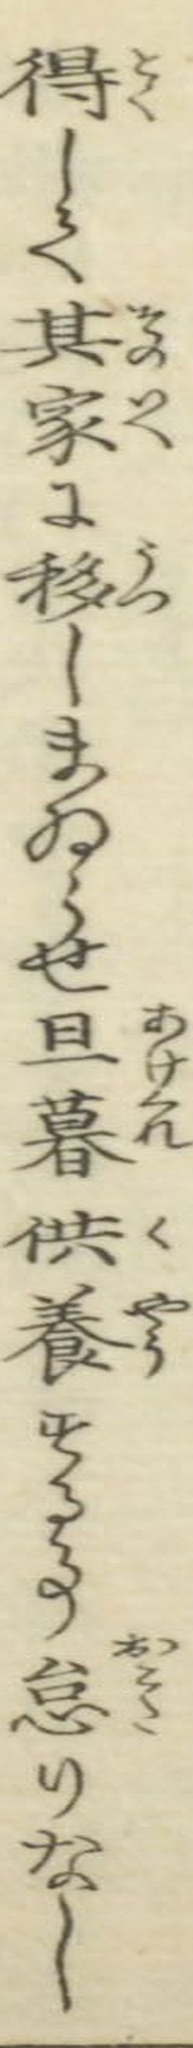得して其家に移しまゐらせ旦暮供養する事怠りなし
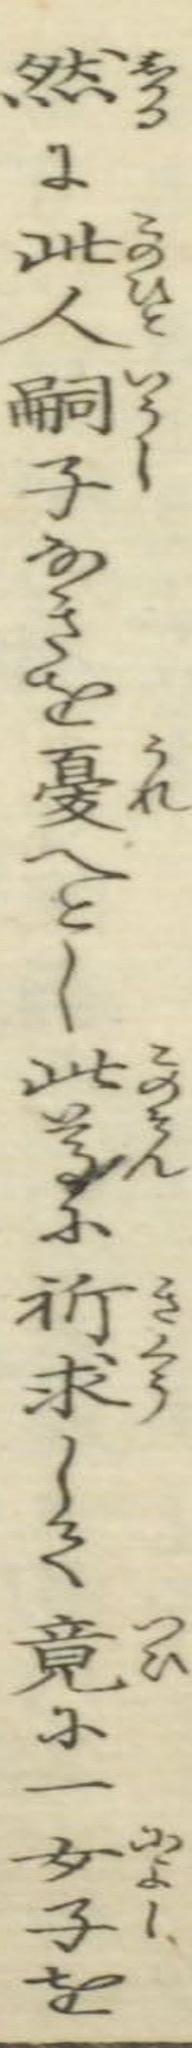然に此人嗣子なきを憂へとし此尊に祈求して竟に一女子を
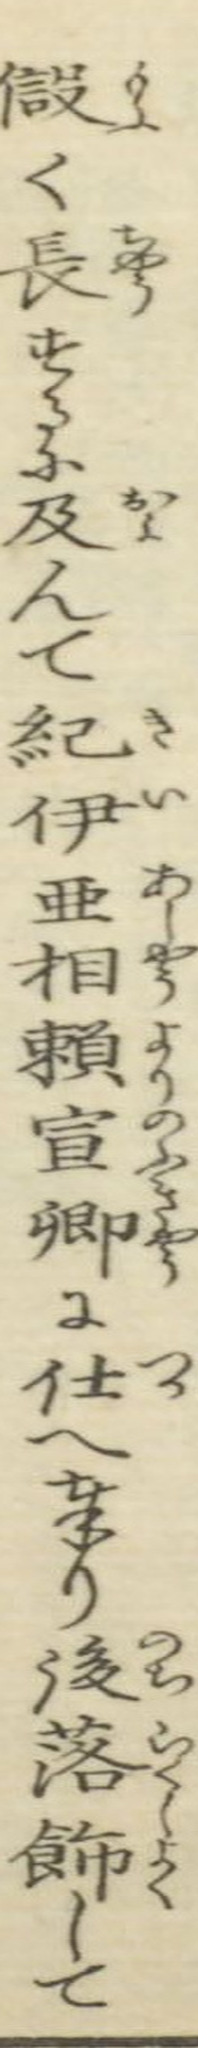く長するに及んて紀伊亜相頼宣卿に仕へ奉り後落飾して
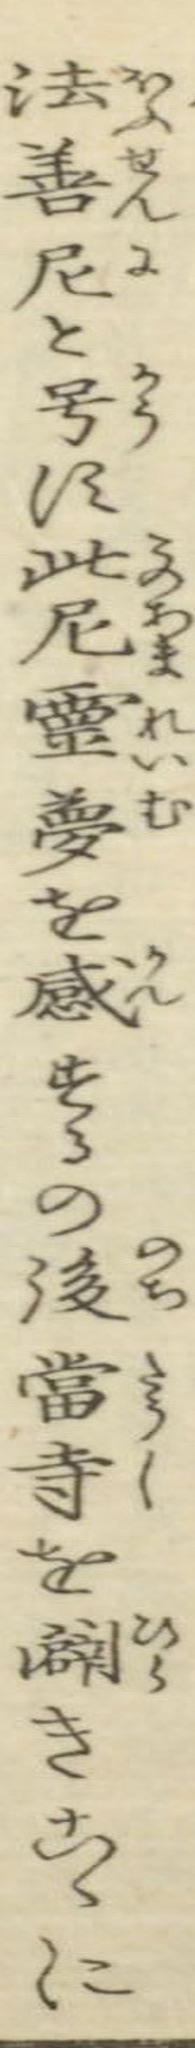法善尼と号す此尼霊夢を感するの後當寺を闢きこゝに
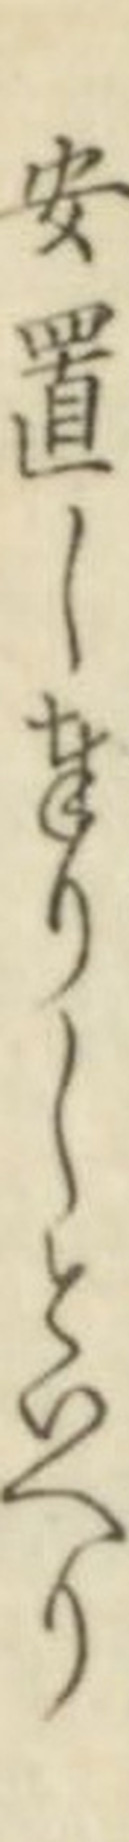安置し奉りしといへり
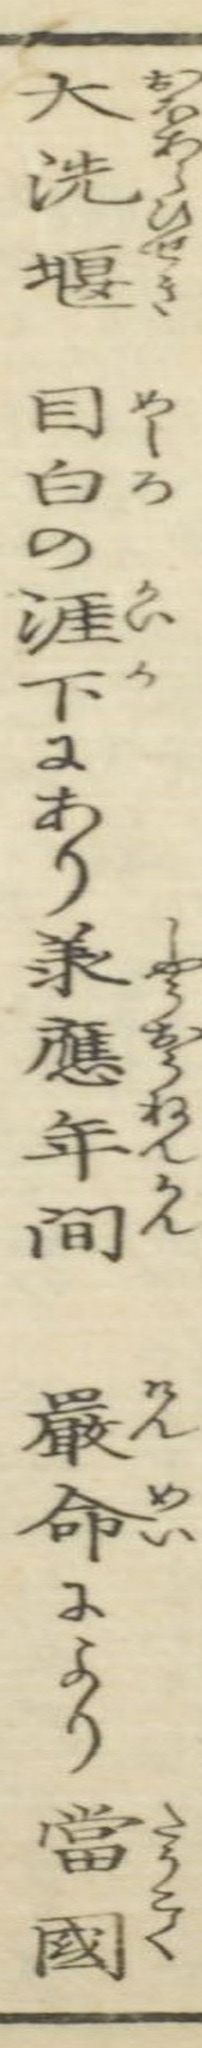大洗堰目白の涯下にあり承應年間嚴命により當國
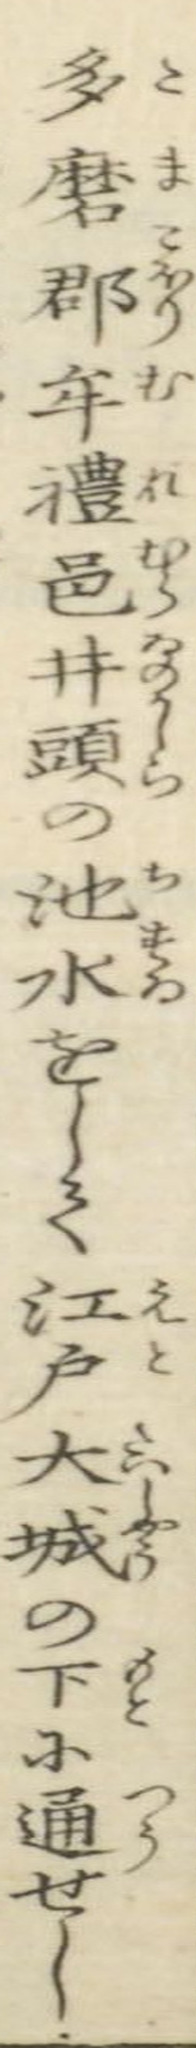多磨郡牟禮邑井頭の池水をして江戸大城の下に通せし
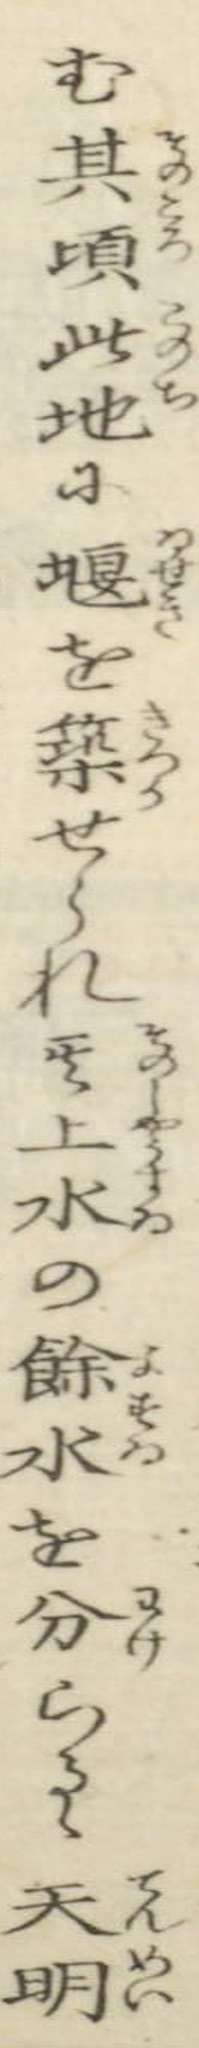む其頃此地に堰を築せられ其上水の餘水を分らるゝ天明
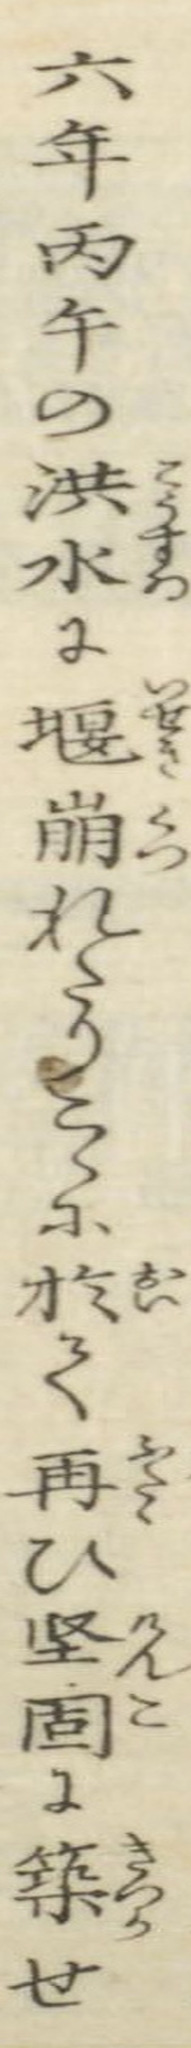六年丙午の洪水に堰崩れたりこゝに於て再ひ堅固に築せ
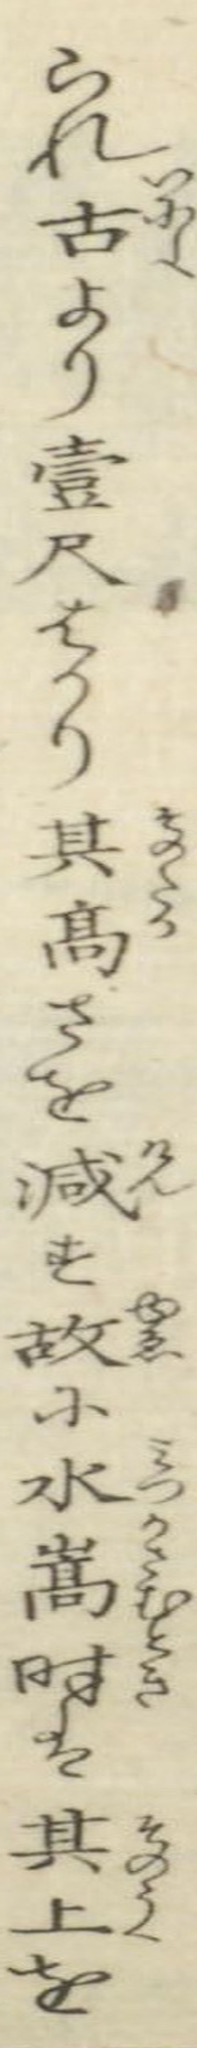られ古より壹尺はかり其髙さを減す故に水嵩時は其上を
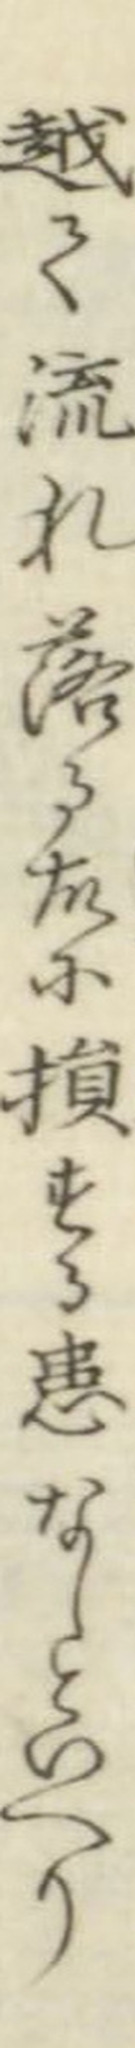越て流れ落る故に損する患なしといへり
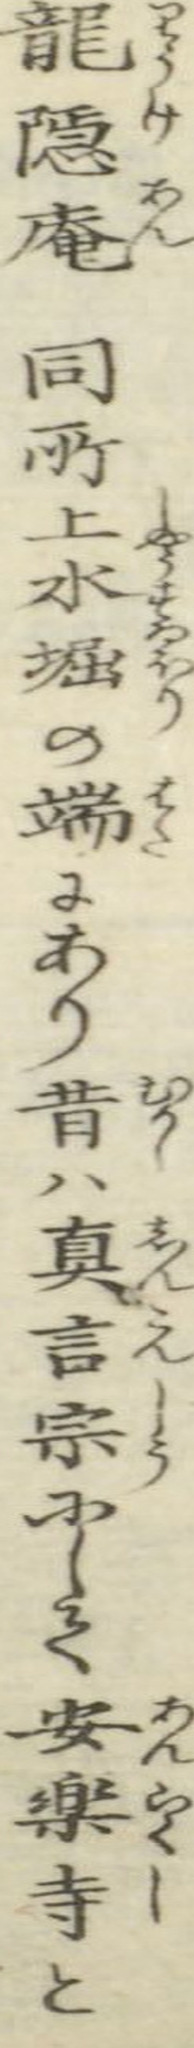龍隠庵同所上水堀の端にあり昔は真言宗にして安楽寺と
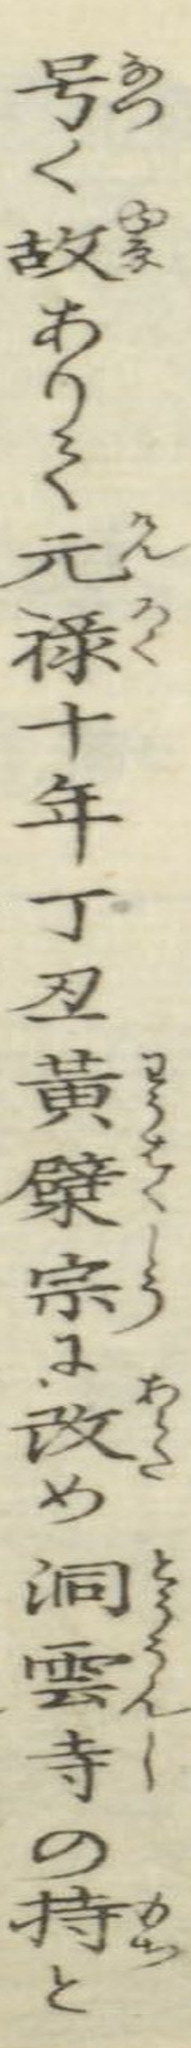号く故ありて元禄十年丁丑黄檗宗に改め洞雲寺の持と
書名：江戸名所図会 20巻 巻之12
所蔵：東京学芸大学教育コンテンツアーカイブ
